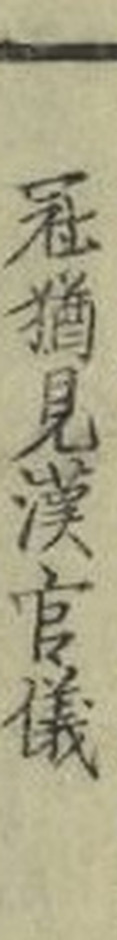冠猶見漢官儀
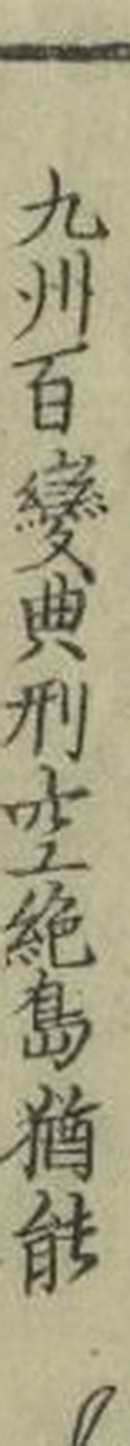九州百変典刑空絶島猶能
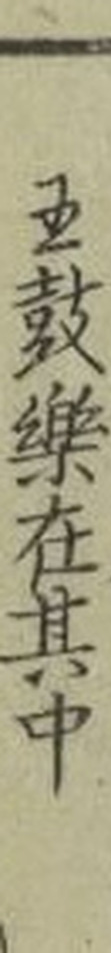王鼓楽在其中
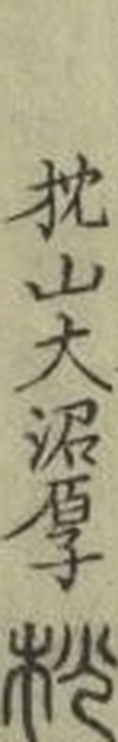枕山大沼厚

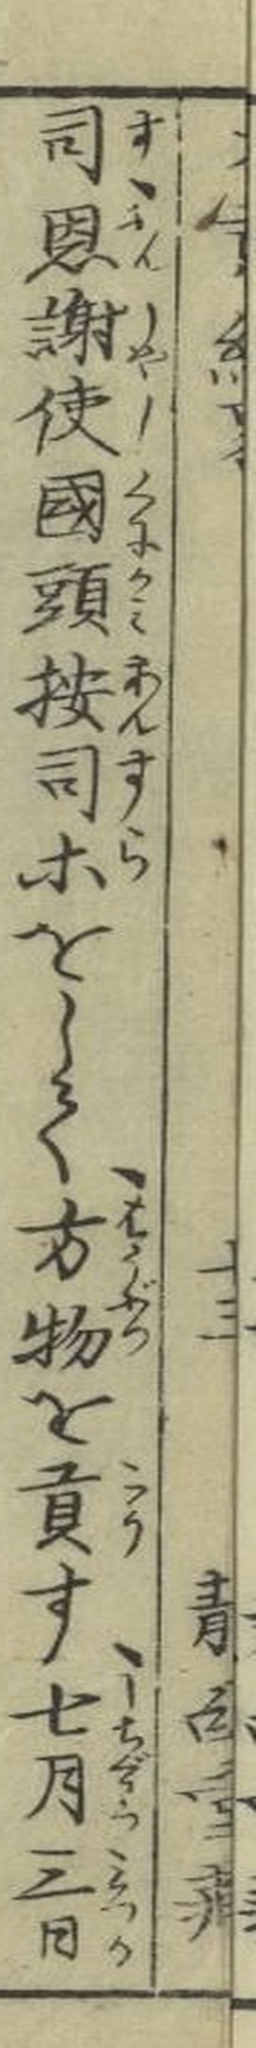司、恩謝使国頭按司等をして、方物を貢す、七月三日
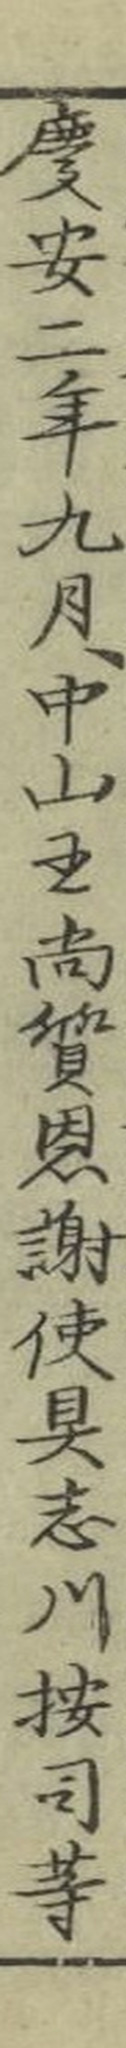慶安二年九月、中山王尚質、恩謝使具志川按司等
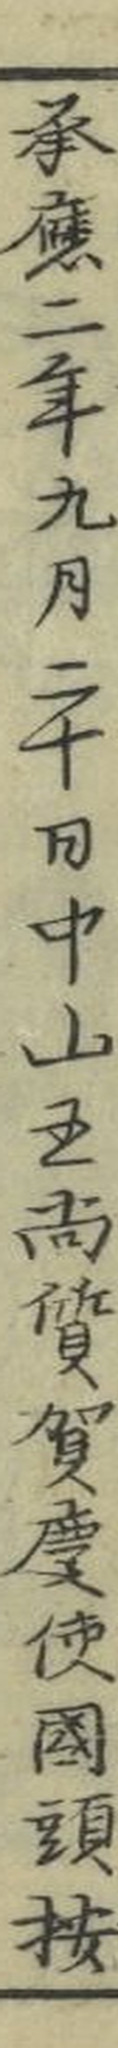承応二年九月二十日、中山王尚質、賀慶使国頭按
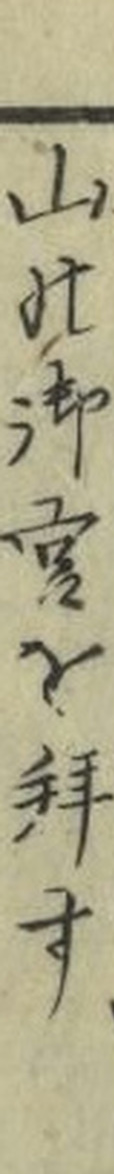山の御宮を拝す、
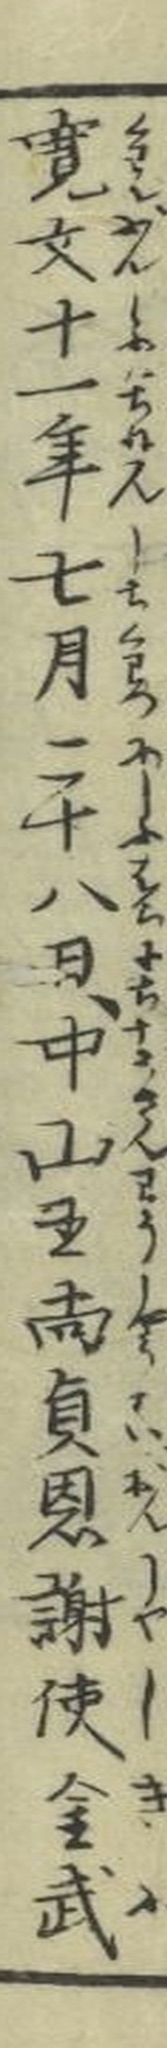寛文十一年七月二十八日、中山王尚貞、恩謝使金武
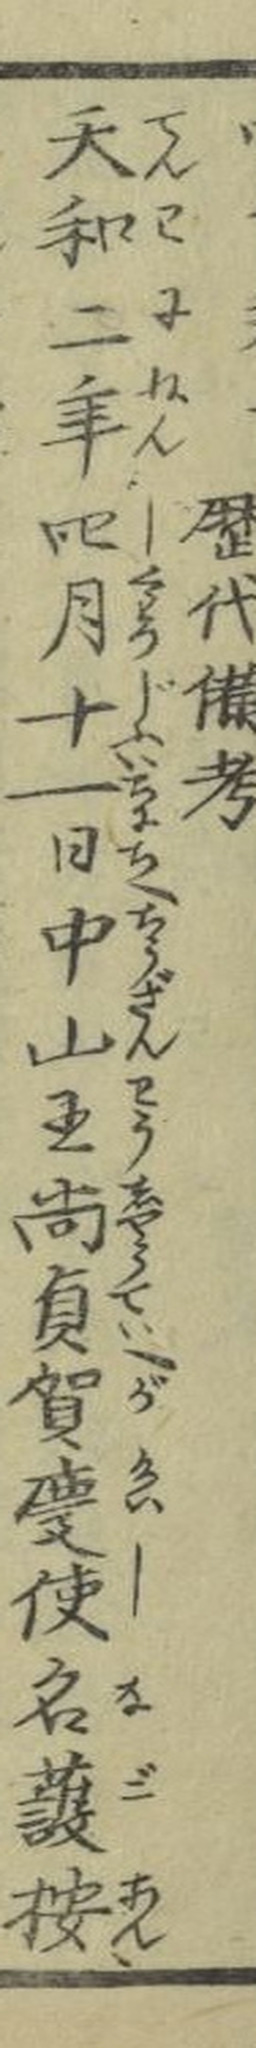天和二年四月十一日、中山王尚貞、賀慶使名護按
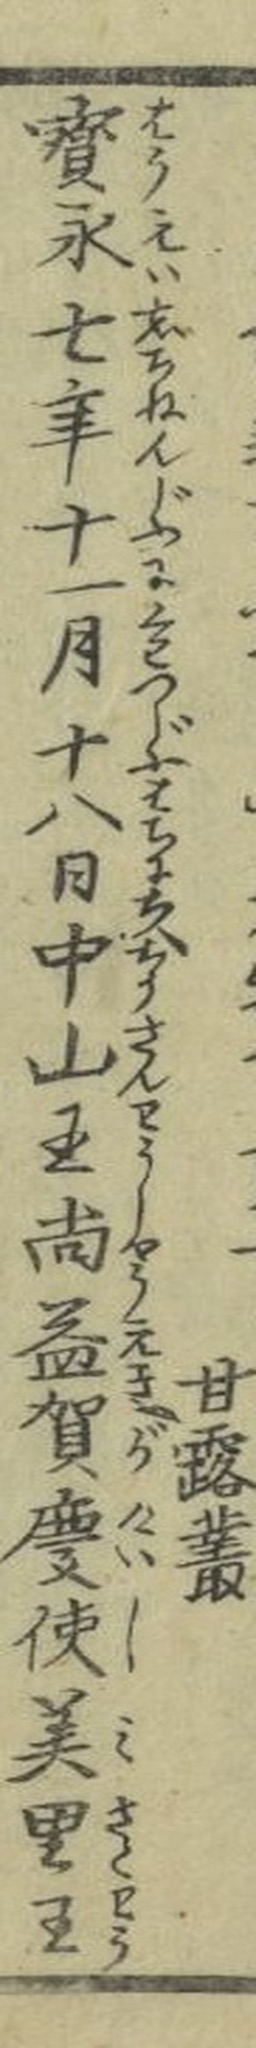宝永七年十一月十八日、中山王尚益、賀慶使美里王
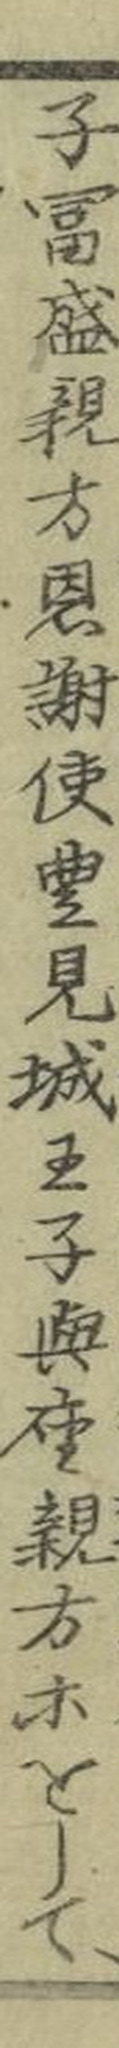子、富盛親方、恩謝使豊見城王子与座親方等をして、
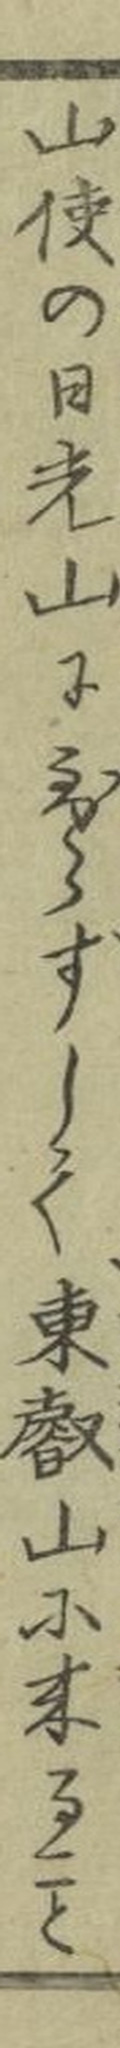山使の日光山に至らずして、東叡山に来ること
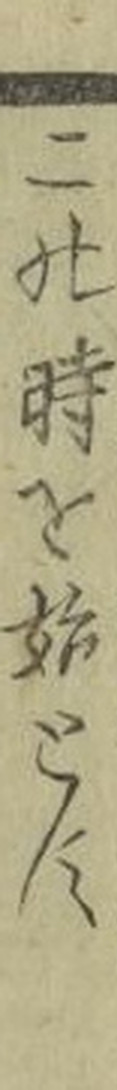この時を始とす、

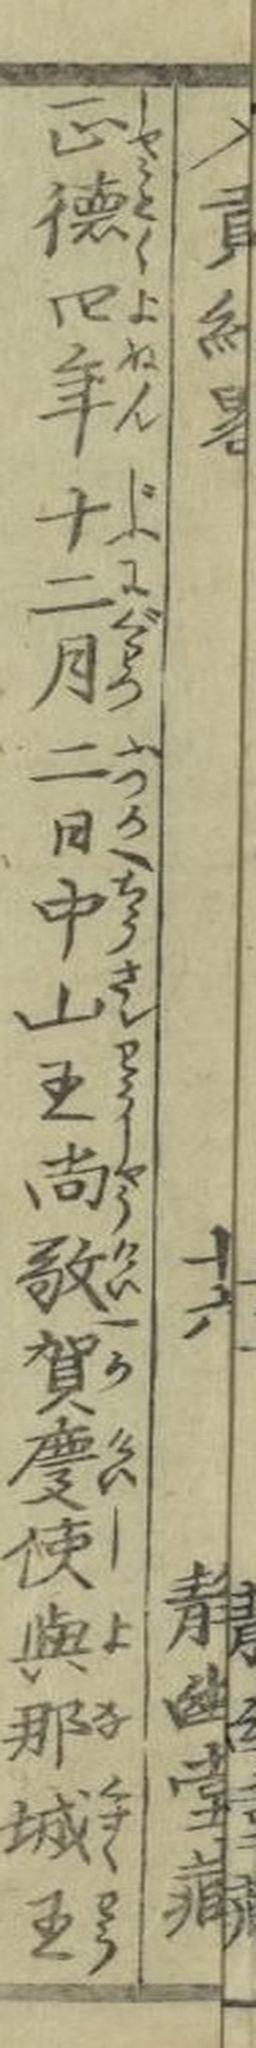正徳四年十二月二日、中山王尚敬、賀慶使与那城王
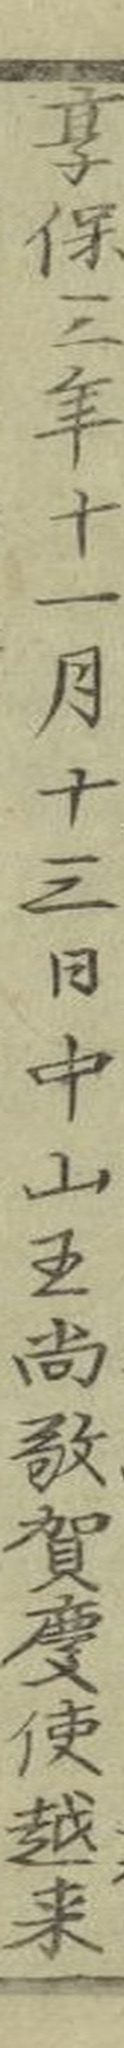享保三年十一月十三日、中山王尚敬、賀慶使越来
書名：琉球入貢紀略
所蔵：University of the Ryukyus Library
